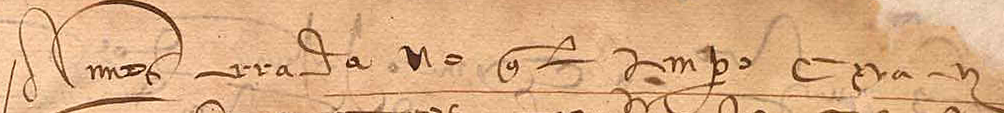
Ann̄os errada no q̄L tempo Crya em
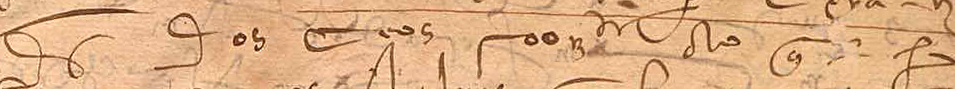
d̄s dos Ceos soomte Ao q̄l ho
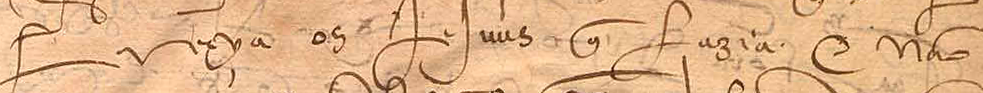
freçya os JeJuus q̄ fazia E naõ
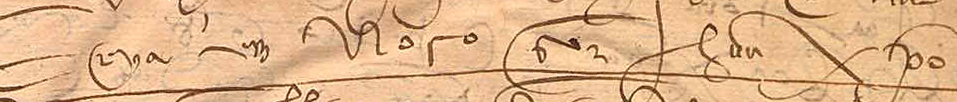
Crya em Noso s̄or Jhuū Xp̄o
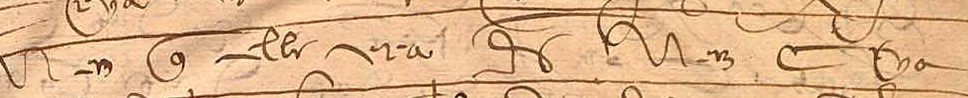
Nem q̄ elle era d̄s Nem Crya
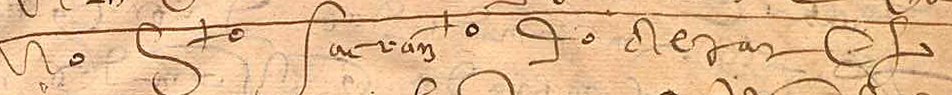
No Sto Sacramto do Altar e ho
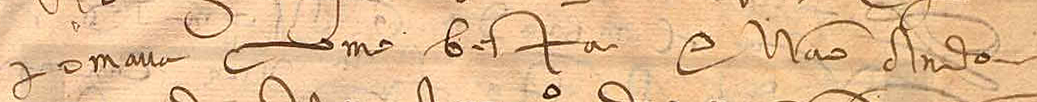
tomaua Como besta E Não Andou
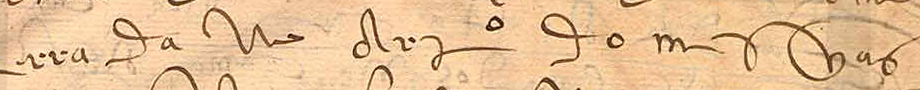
errada No Arto do mesyas
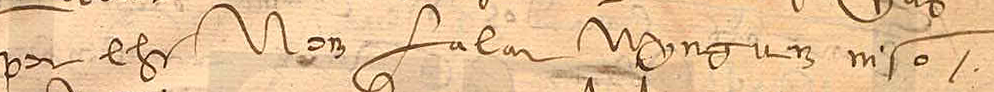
por lhe Nom falar Nynguem niso /.
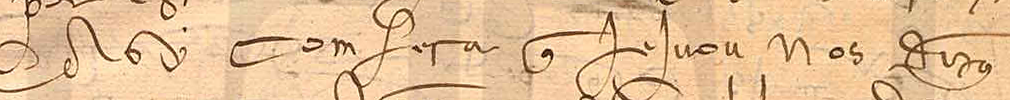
e Asy Comfesa q̄ JeJuou nos di̅tꝯ
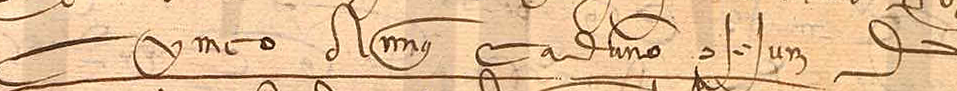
Cymco Annꝯ cadan̄o o JeJum do
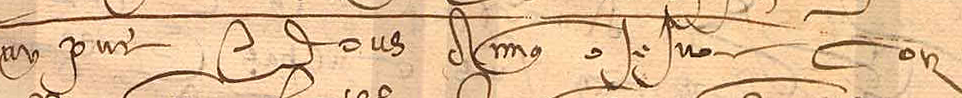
quypur E dous An̄nꝯ o JeJuou Com
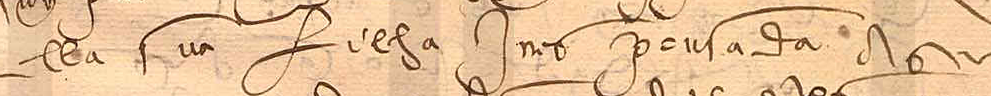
ella sua filha Jnes pousada A se
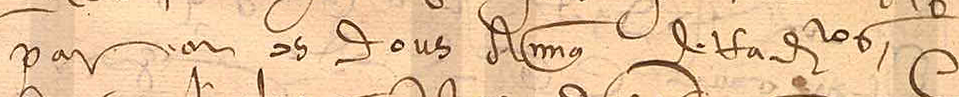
parecer os dous Ann̄ꝯ deRadros / E
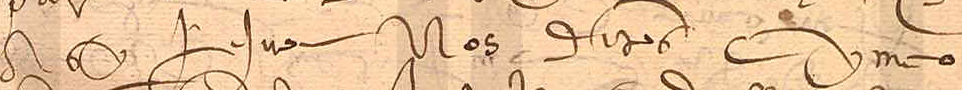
Asy JeJuou Nos dit̄os Cymco
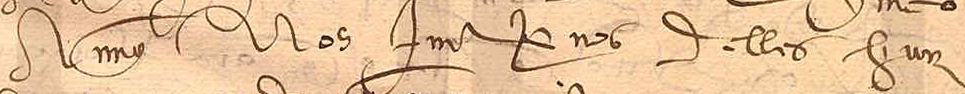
Ann̄ꝯ Nos Jmꝟnos delles hum
